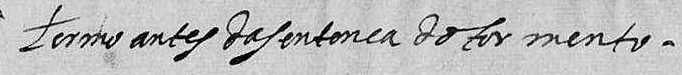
Termo antes da sentença do tormento.
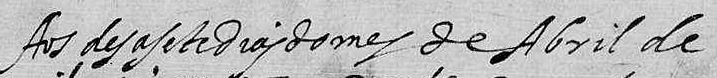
Aos desasete dias do mes de Abril de
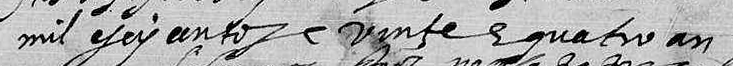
mil e seiscentos e vinte E quatro an
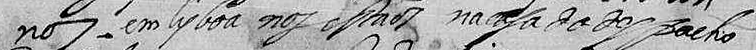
nos em lisboa nos estaos na casa do despacho
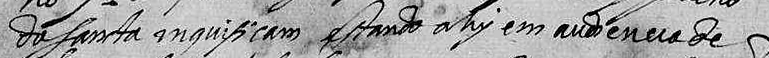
da santa inquisiçam estando ahy em audiencia de
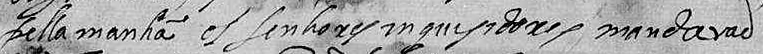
pella manhã os senhores inquisidores mandaraõ
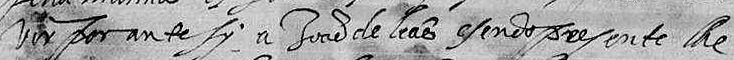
vir porante sy a Ioaõ de leaõ e sendo presente lhe
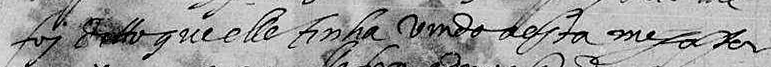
foj ditto que elle tinha vindo a esta mesa por
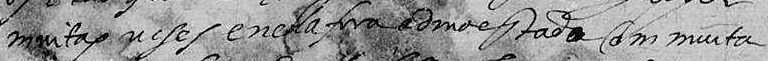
muitas ueses e nella fora admoestado com muita
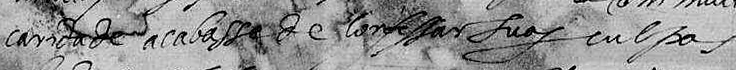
caridade acabasse de confessar suas culpas
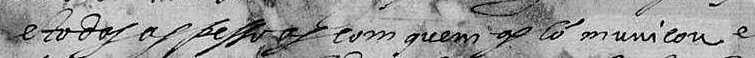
e todas as pessoas com quem as cōmunicou e
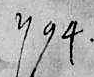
94.
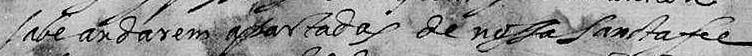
sabe andarem apartadas de nossa sancta fee
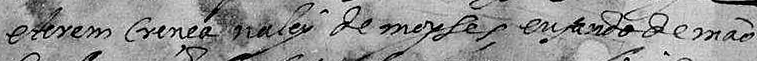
e terem crença na ley de moyses, e usando de māo
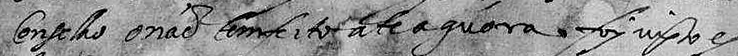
Conselho o naõ tem feito ate aguora foy uisto es
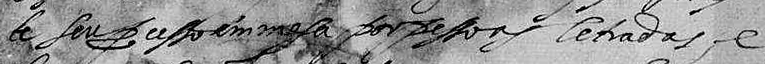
te seu ꝓcesso em mesa por pessoas letradas, e
